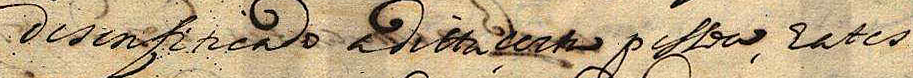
desenfitiçado a ditta certa pessoa, E a tes
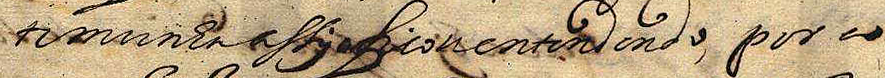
temunha assy ficou entendendo, por a
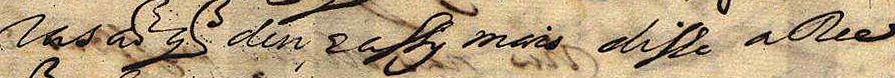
rasaõ q̄ deu, E assy mais disse a Ree
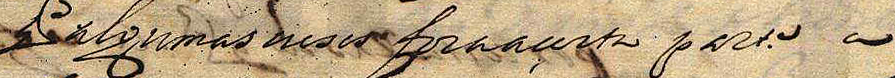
q̄ algumas ueses fora a certa parte a
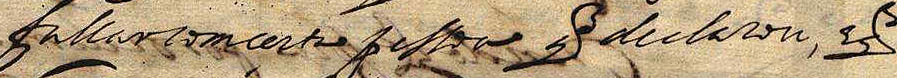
fallar com certa pessoa q̄ declarou, E q̄
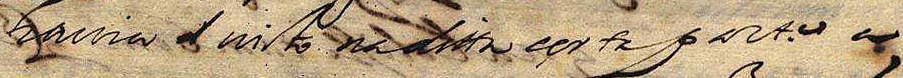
hauia uisto na ditta certa parte a
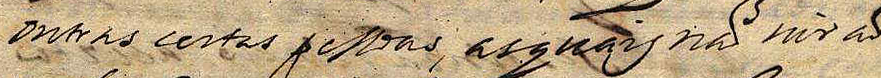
outras certas pessoas, as quais naõ uiraõ
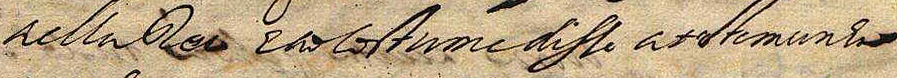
a ella Ree E ao costume disse a testemunha
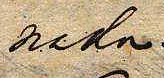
nada.
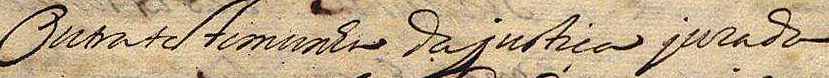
Outra testemunha da justiça jurada
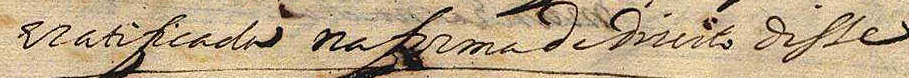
E ratificada na forma de Direito disse
